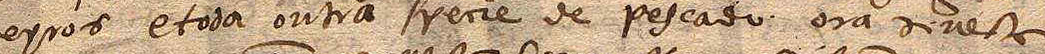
eyros e toda outra specie de pescado. ora teuese
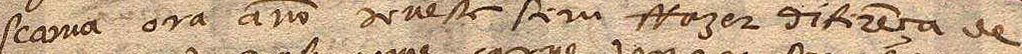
scama ora a n̄o teuese sem ffazer difer̄eça de
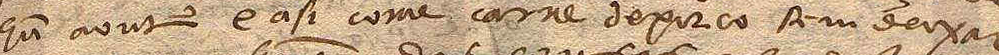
hū a outo e asi come carne de porco sem deixar
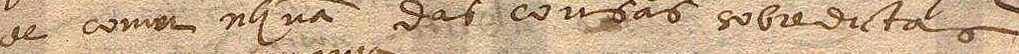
de comer nhūa das cousas sobredictas
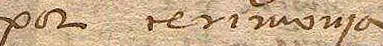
por cerimonja
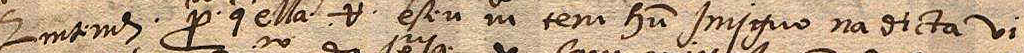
Emtendj. ꝓ̄. q̄ ella. R. e seu mdo tem hū Jmjguo na dicta vi
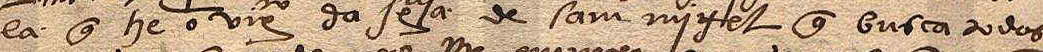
la. q̄ he o vigro da Jḡja. de sam mjgeL q̄ busca todos
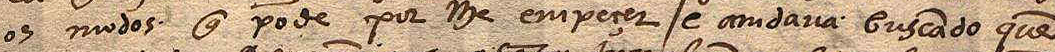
os modos. q̄ pode por lhe empeçer e amdaua. busc̄ado qūe
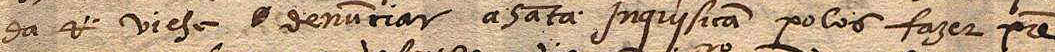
da R. viese _ denūciar a sāta. Jnqujsicā polos fazer pr̄e
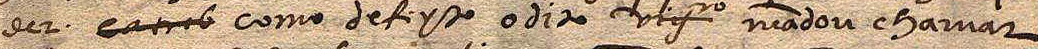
der. e a treb como de feyto o dito vigro m̄adou chamar
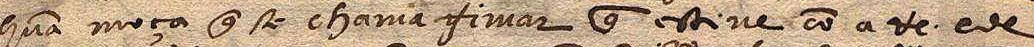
hūa moça q̄ se chama gimar q̄ esteue c̄o a Re. e de
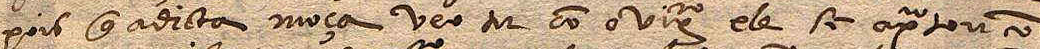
pois q̄ a dicta moça veo ter c̄o o vigro ele se ap̄tou c̄o
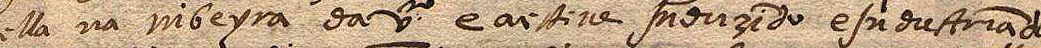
ella na rribeyra davro. e a esteue Jnduzīdo e Jndustrīado
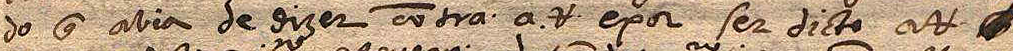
do q̄ avia de dizer c̄otra. a R. e por ser dicto a R. _
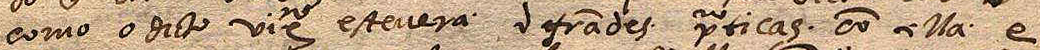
como o dicto vigro esteuera. ē gr̄ades. p̄ticas. c̄o ella. e
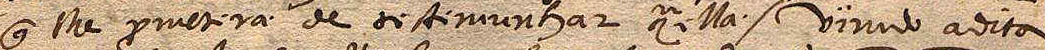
q̄ lhe ꝓmetera. de testemunhar ꝯ̄ ella. / Vimdo a dita
